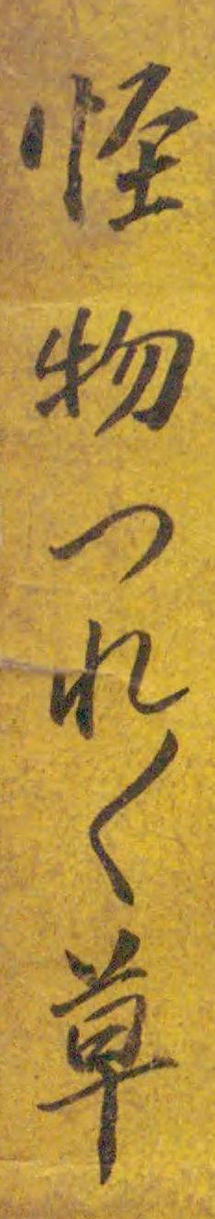怪物つれ〳〵草

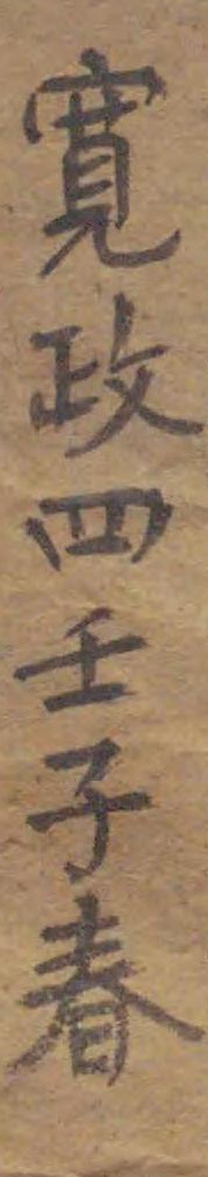寛政四壬子春
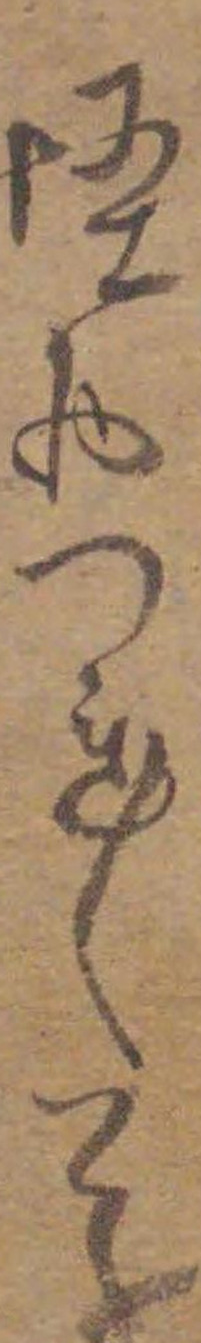怪物つれ〳〵草

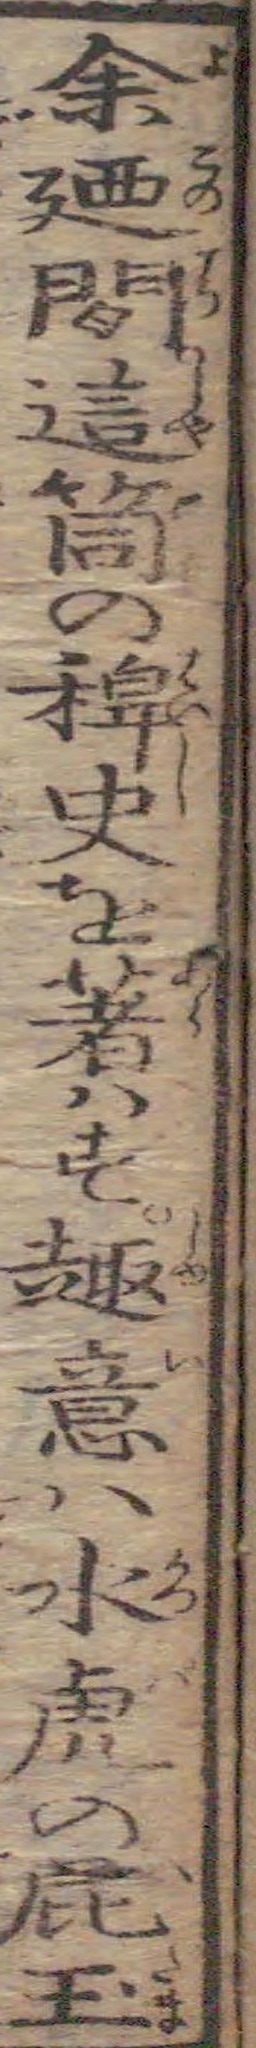余廼間這筒の稗史を著はす。趣意は水虎の屁玉
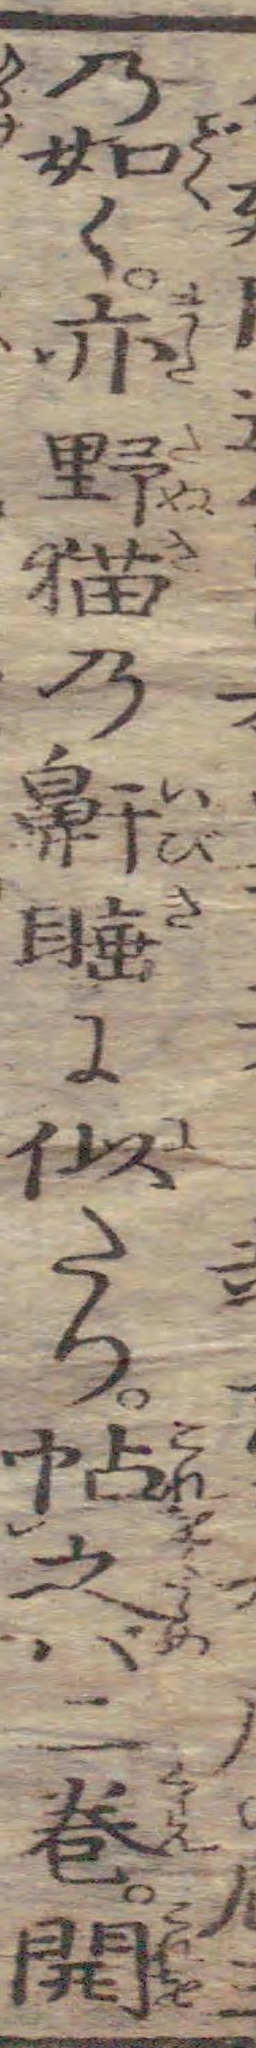の如く。亦野猫の鼾睡に似たり。帖之バ二巻。開
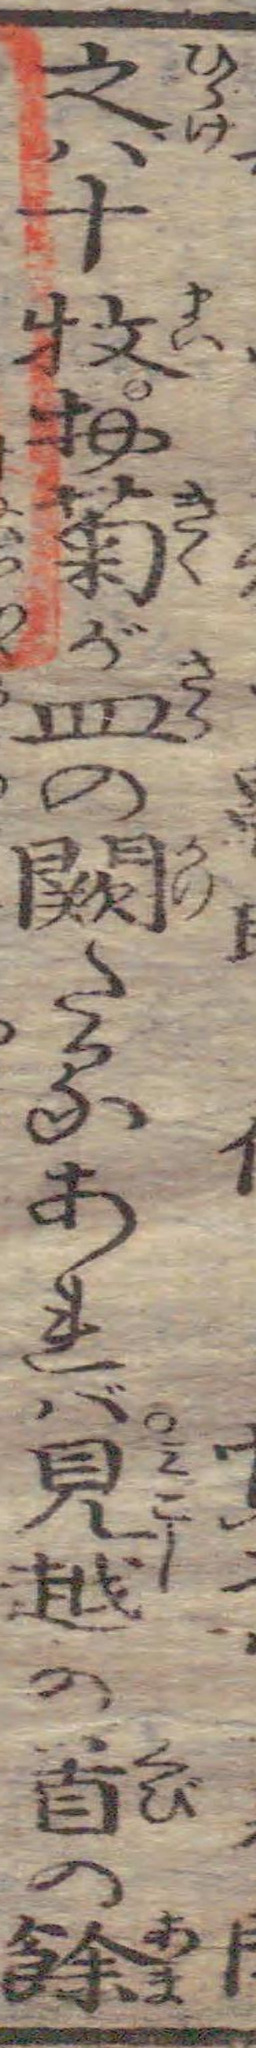之は十枚。お菊が皿の闕たるあれば。見越の首の餘
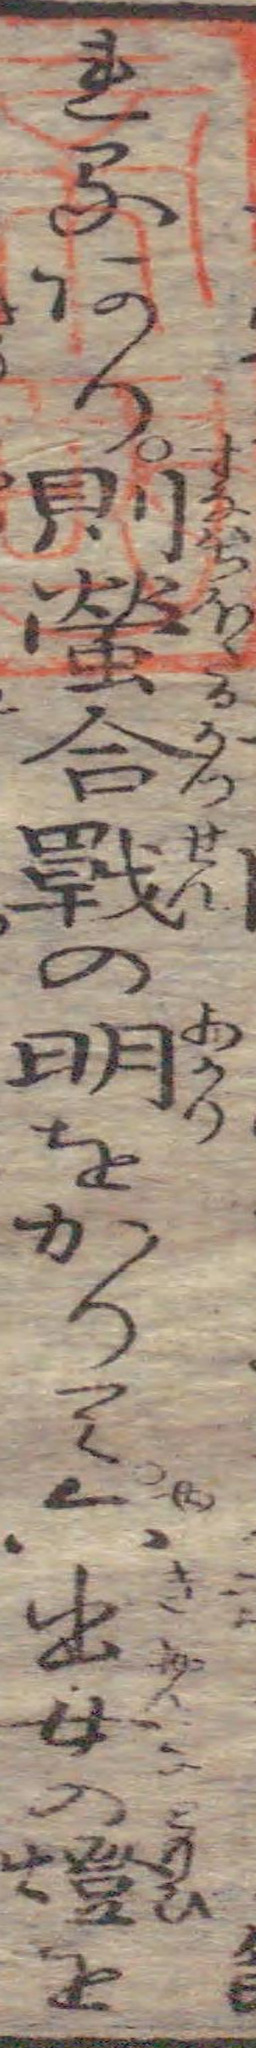れるあり。則蛍合戦の明をかりて。六出女の燈を
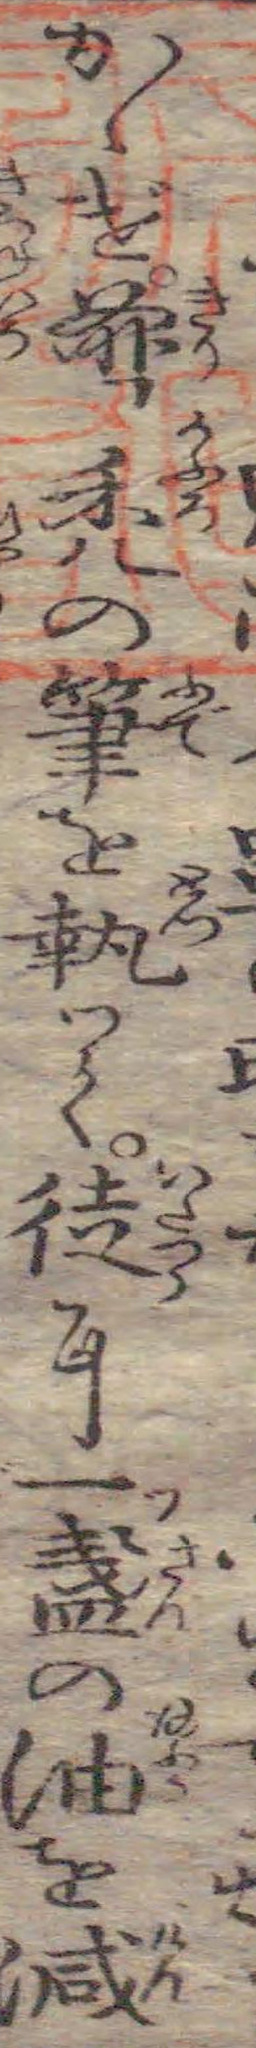かゝげ。剪禿の筆を執つて。徒に一ツ盞の油を減
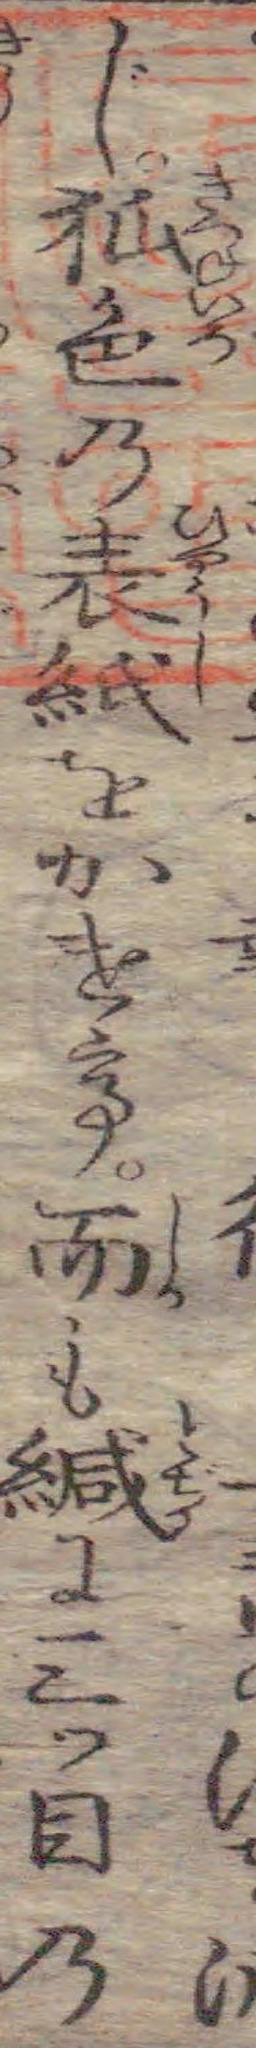じ。狐色の表紙をかけて。而も緘に三ツ目の
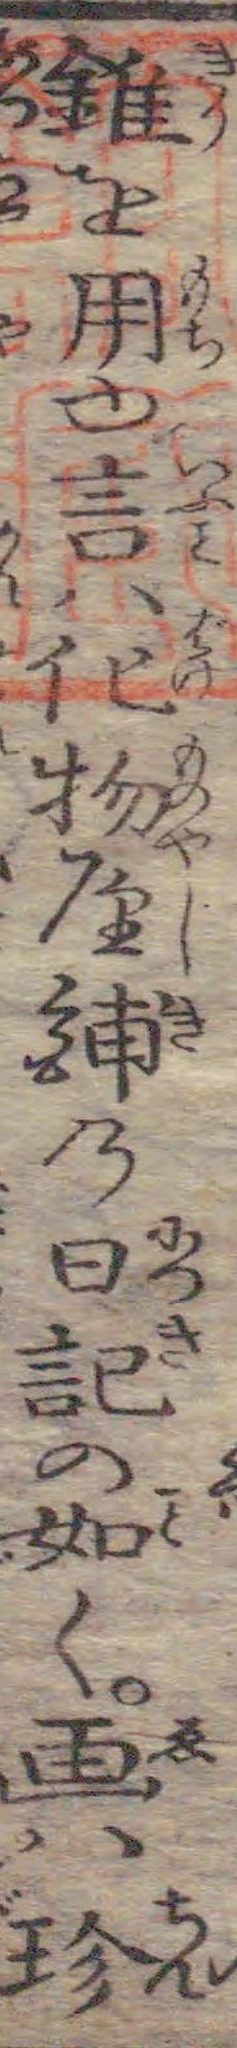錐を用ゆ言は化物屋鋪の日記の如く。画は珍
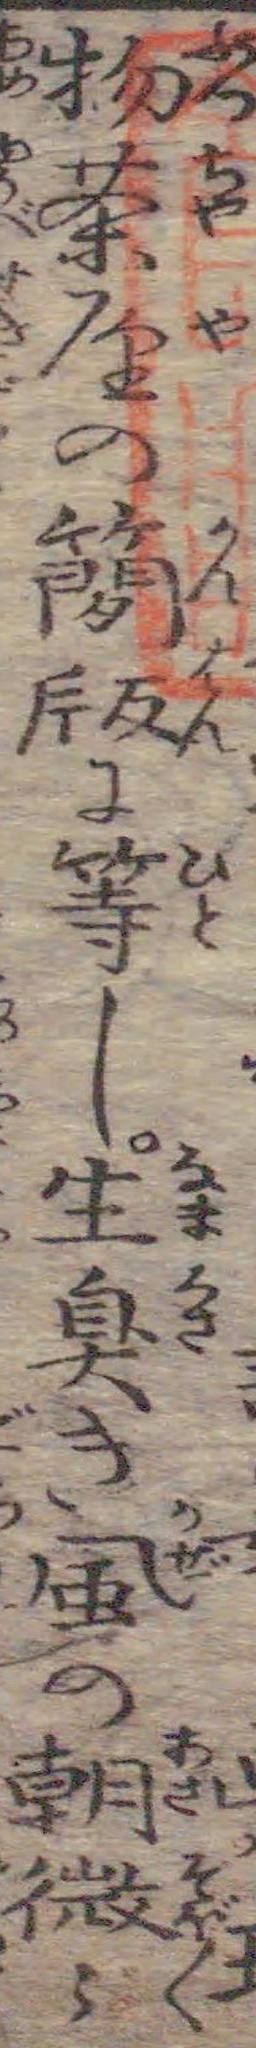物茶屋の簡版に等し。生臭き風の朝微々
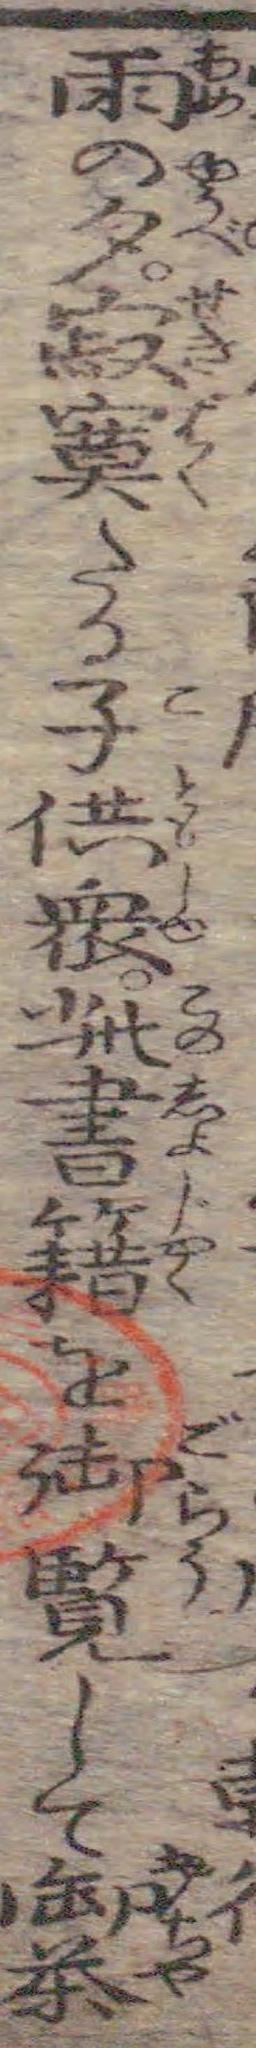雨の夕。寂寞たる子供衆。此書籍を御覧して御茶
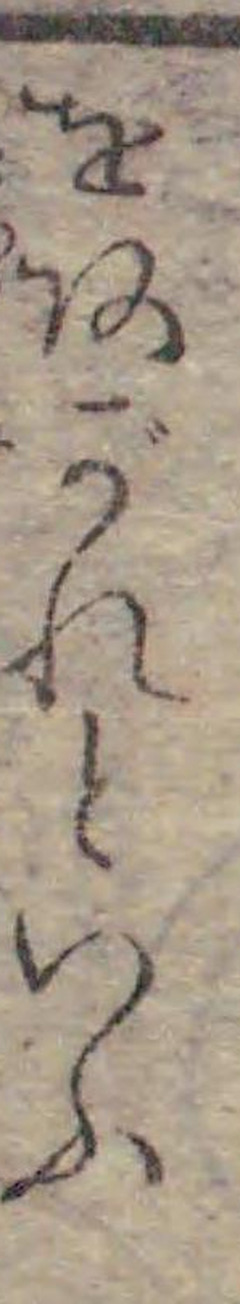をあがれといふ

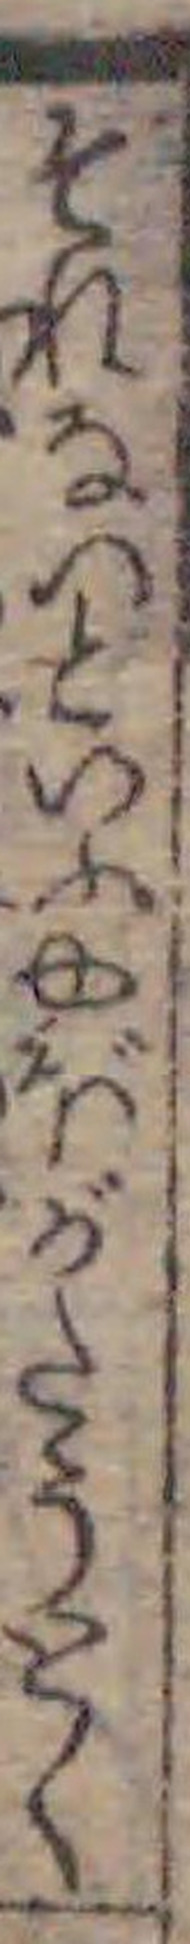それないといふやぼがたうとく
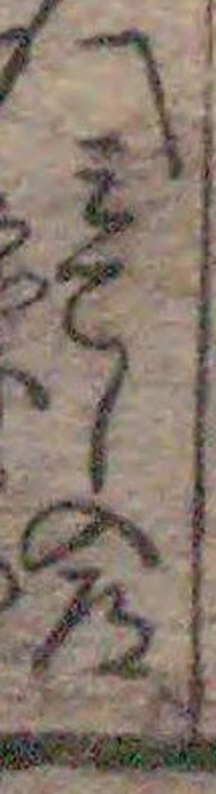〽みこし入道
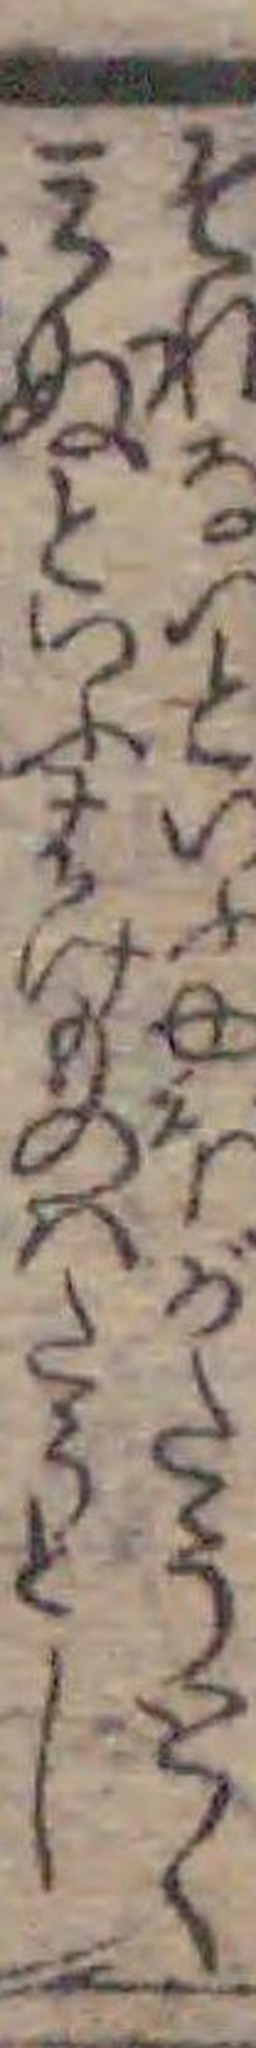みぬといふはけものはたうとし
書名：怪物つれつれ草 : 2巻
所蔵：国立国会図書館 National Diet Library, JAPAN
